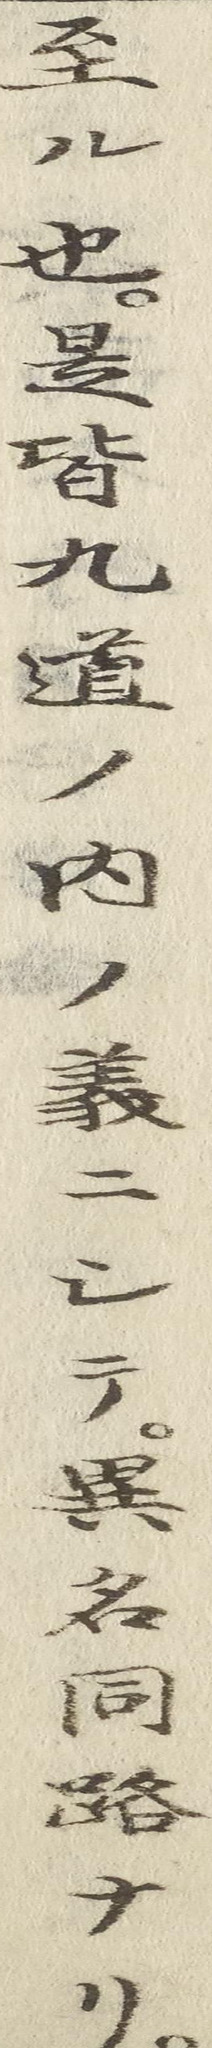至ル也。是皆九道ノ内ノ義ニシテ。異名同路ナリ。
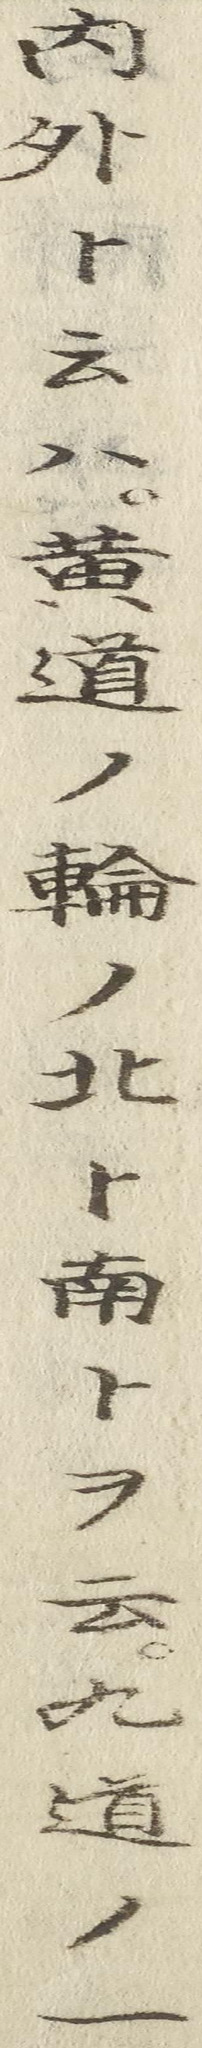内外ト云ハ。黄道ノ輪ノ北ト南トヲ云。九道ノ一
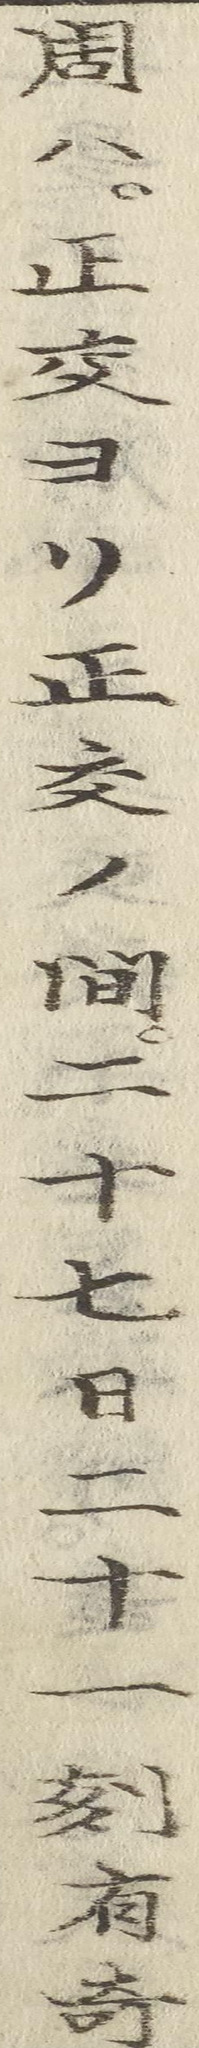周ハ。正交ヨリ正交ノ間。二十七日二十一刻有奇

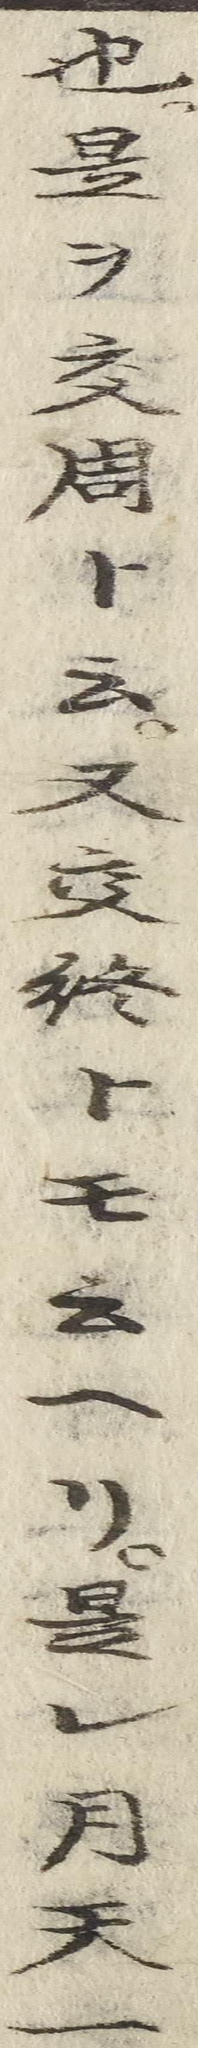也。是ヲ交周ト云。又交終トモ云ヘリ。是レ月天一
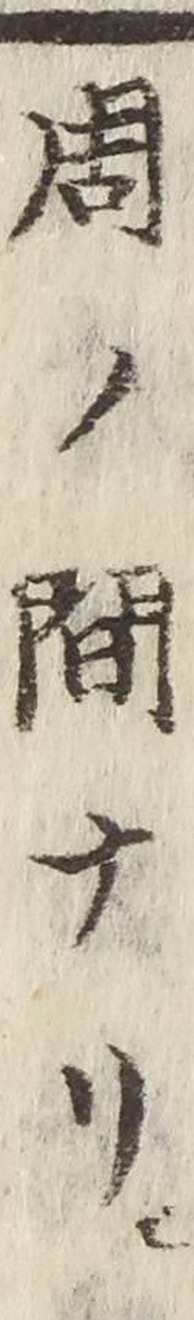周ノ間ナリ。
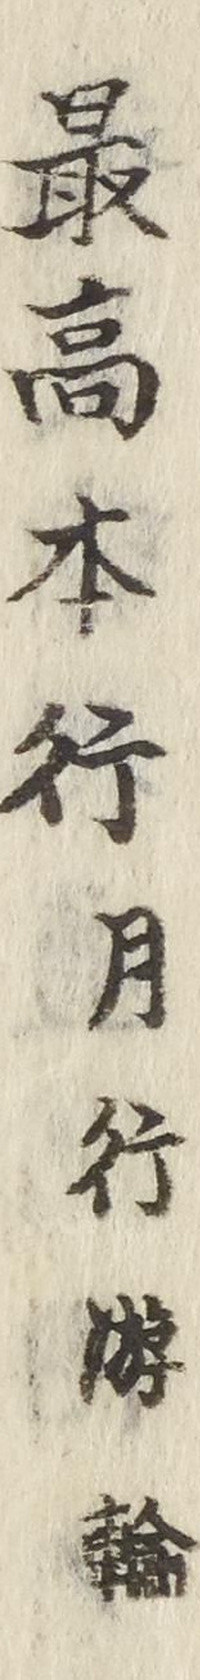最高本行月行游輪
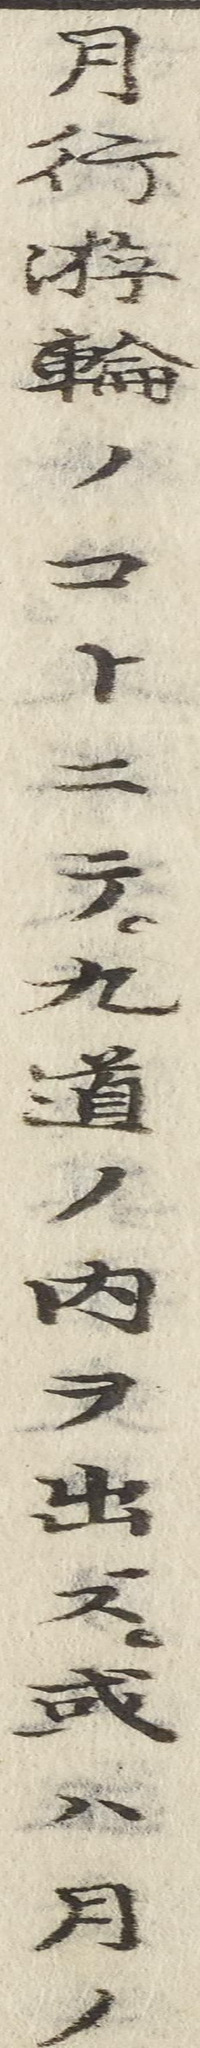月行游輪ノコトニテ。九道ノ内ヲ出ズ。或ハ月ノ
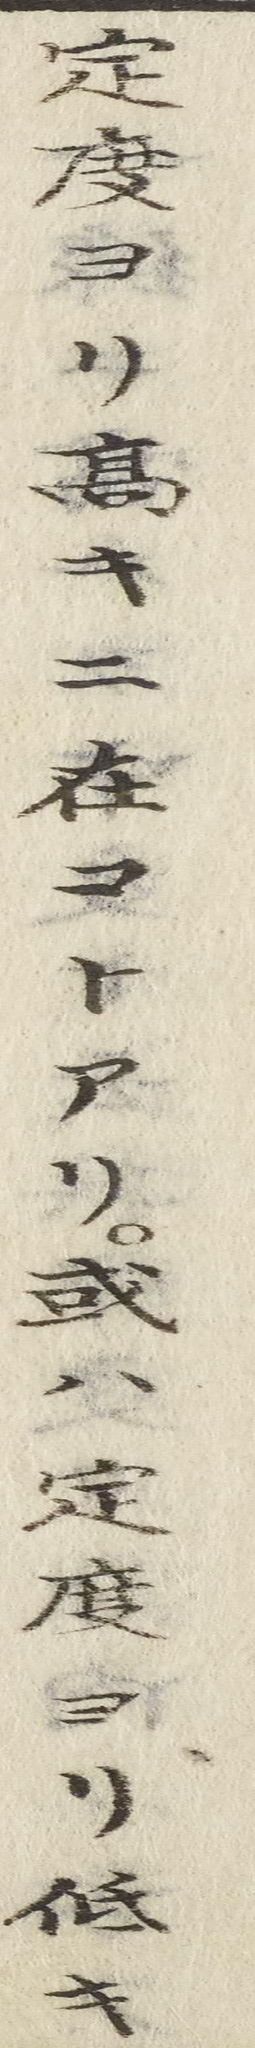定度ヨリ高キニ在コトアリ。或ハ定度ヨリ低キ
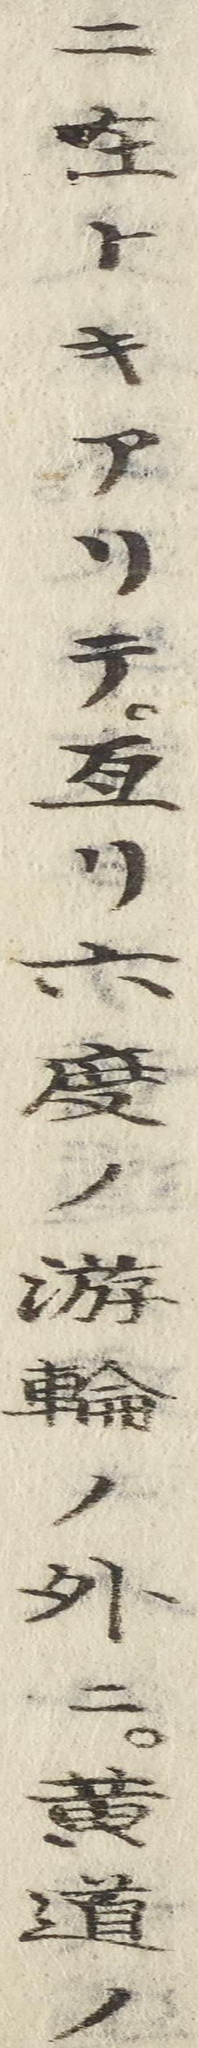ニ在トキアリテ。亙リ六度ノ游輪ノ外ニ。黄道ノ
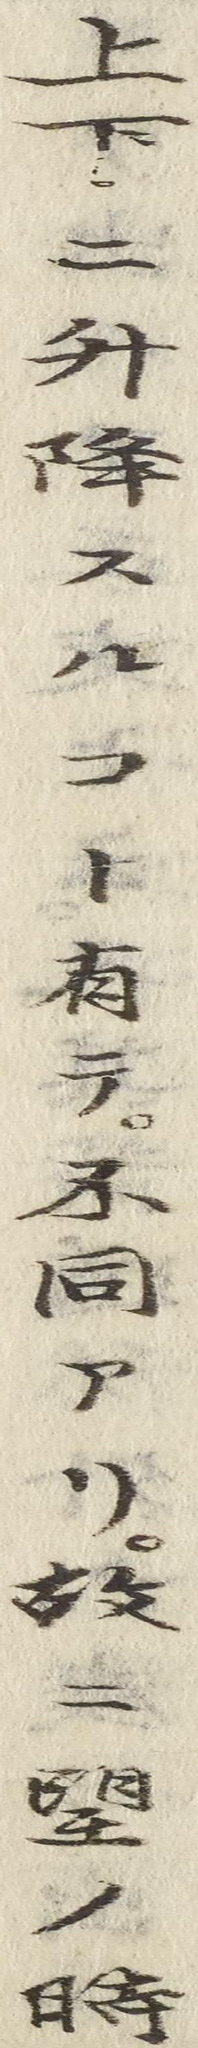上下ニ升降スルコト有テ。不同アリ。故ニ望ノ時
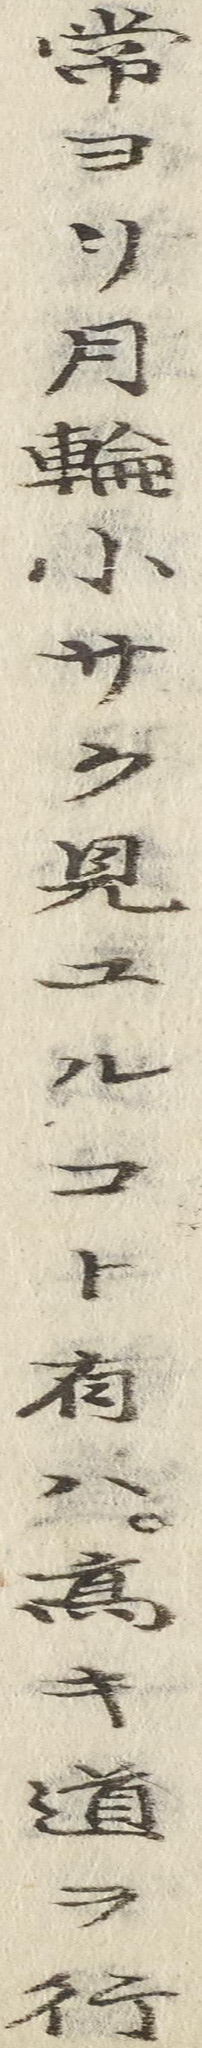常ヨリ月輪小サク見ユルコト有ハ。高キ道ヲ行
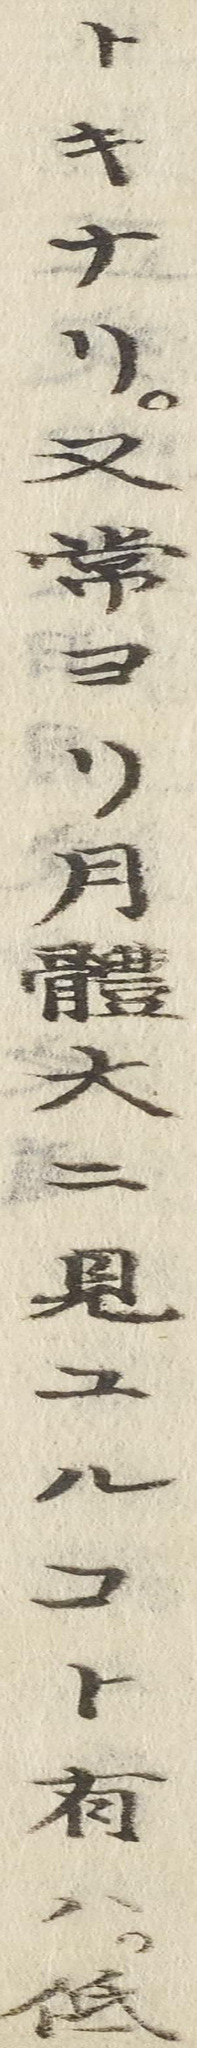トキナリ。又常ヨリ月体大ニ見ユルコト有ハ。低
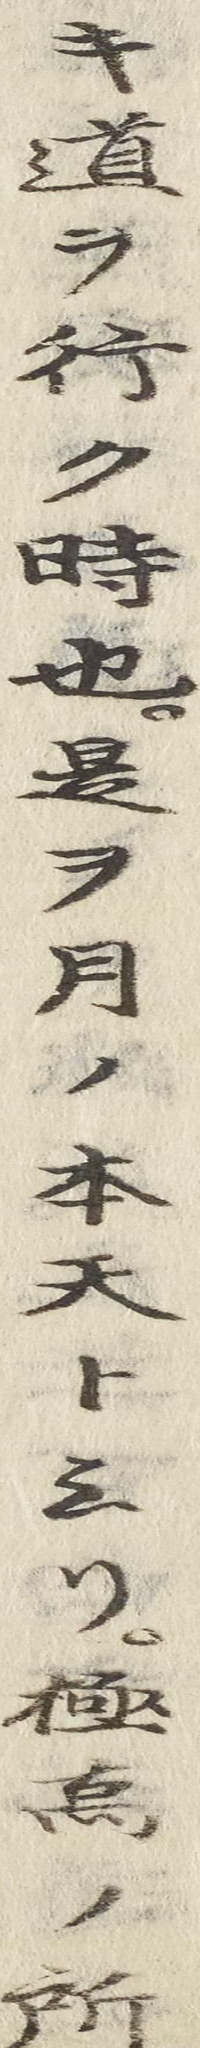キ道ヲ行ク時也。是ヲ月ノ本天ト云リ。極高ノ所
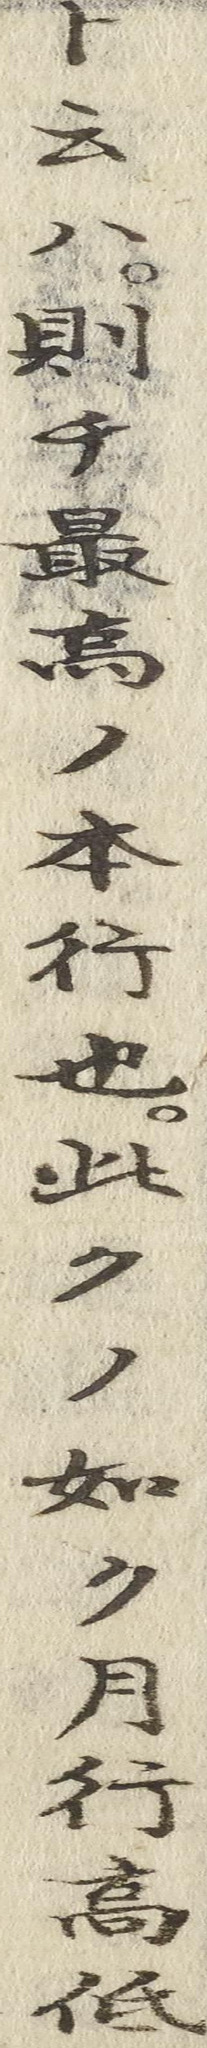ト云ハ。即チ最高ノ本行也。此クノ如ク月行高低
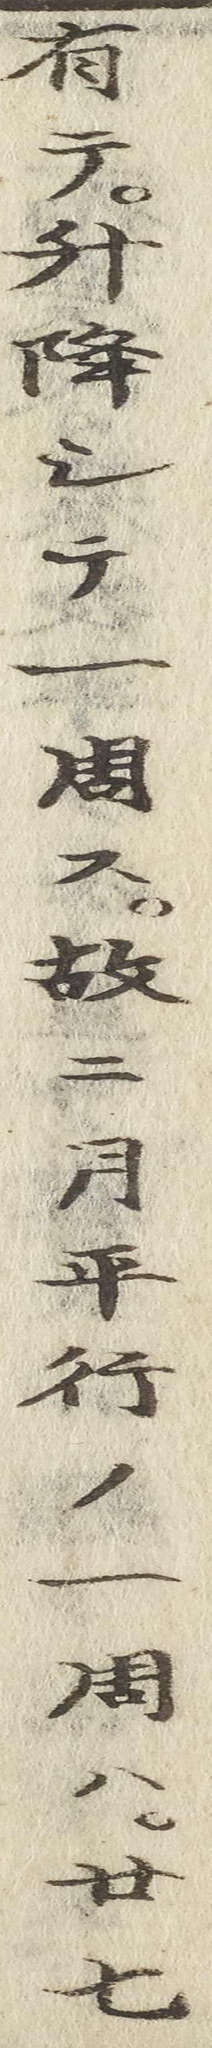有テ。升降シテ一周ス。故ニ月平行ノ一周ハ。廿七
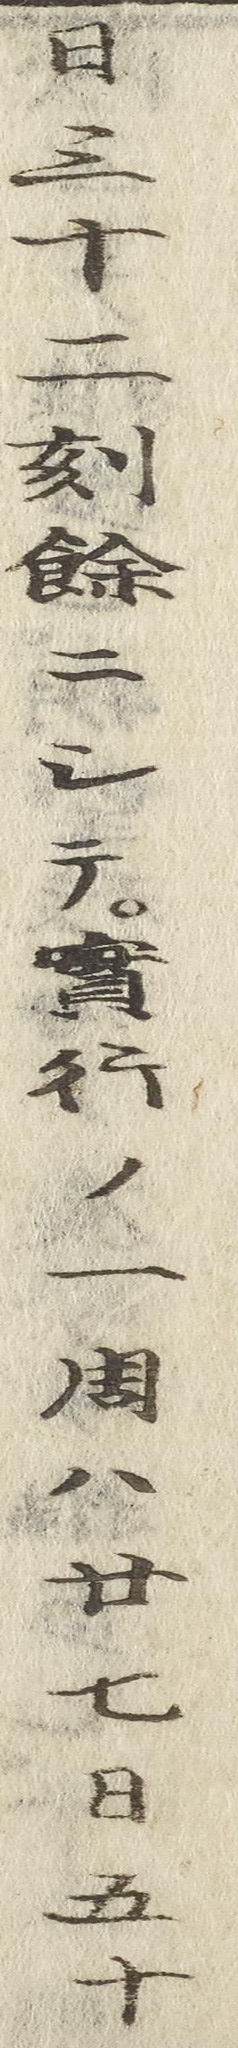日三十二刻余ニシテ。実行ノ一周ハ廿七日五十
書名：大略天学名目鈔　天經或問附録
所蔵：東京大学地震研究所図書室 Earthquake Research Institute Library, The University of Tokyo, JAPAN
